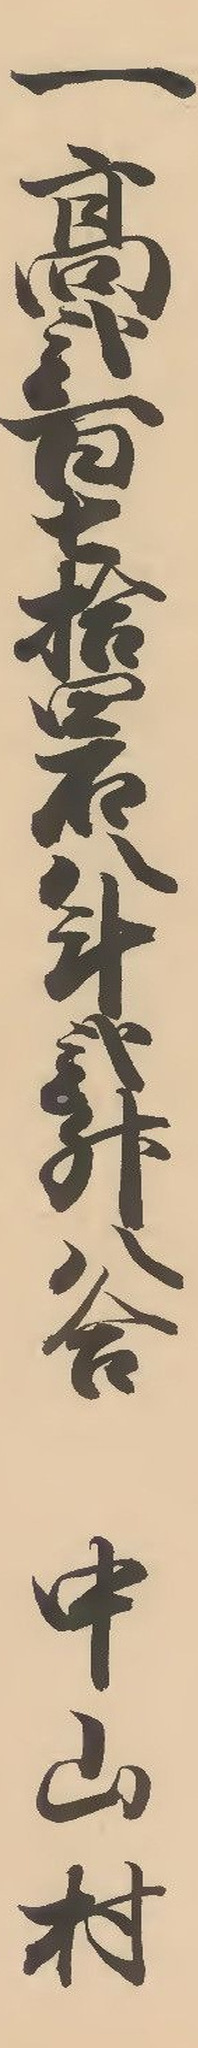一髙弐百七拾四石八斗弐升八合中山村

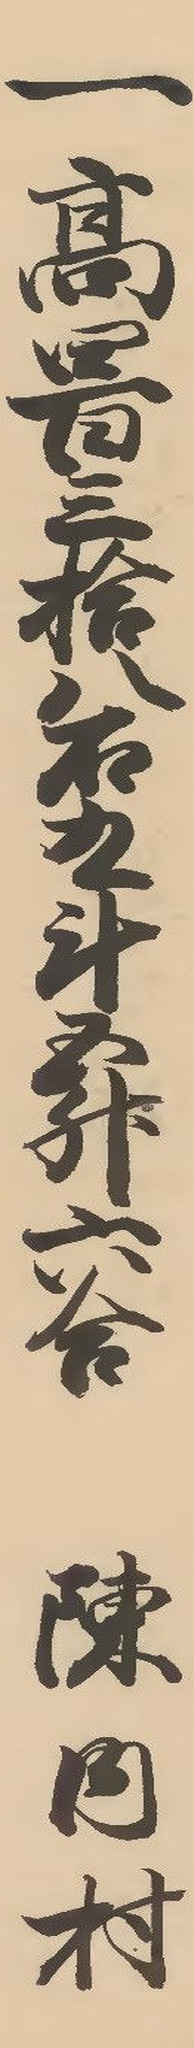一髙四百三拾八石九斗五升六合陳内村
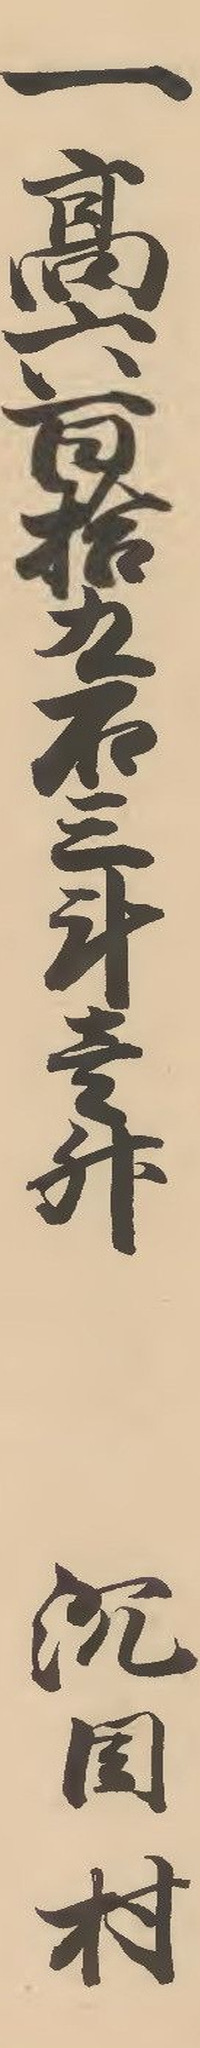一髙六百拾九石三斗壱升沈目村
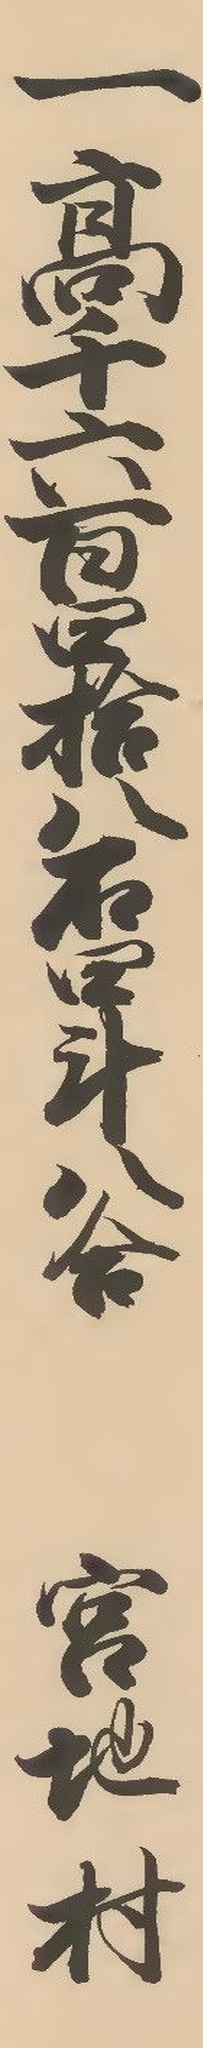一髙千六百四拾八石四斗八合宮地村
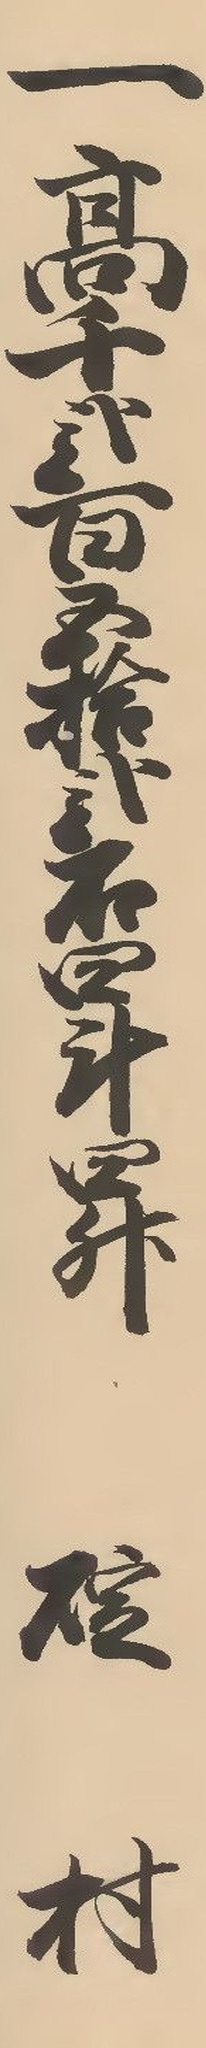一髙千弐百五拾弐石四斗四升村
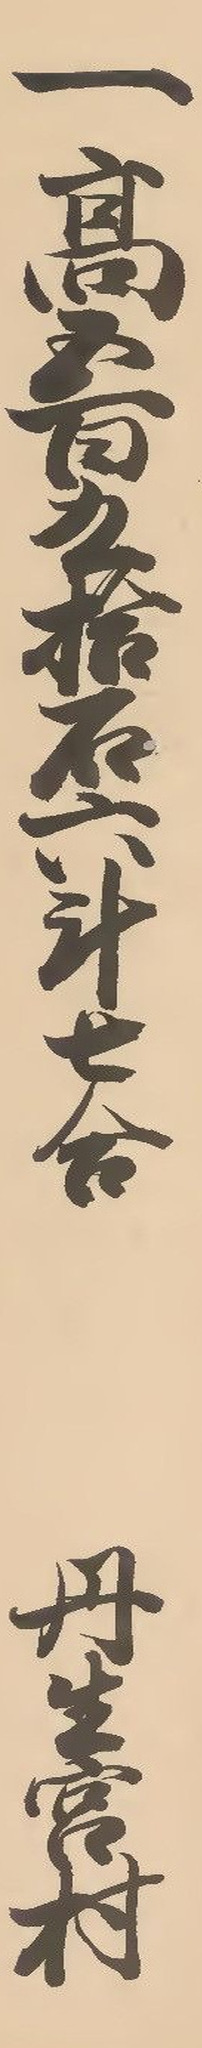一髙五百九拾石六斗七合丹生宮村
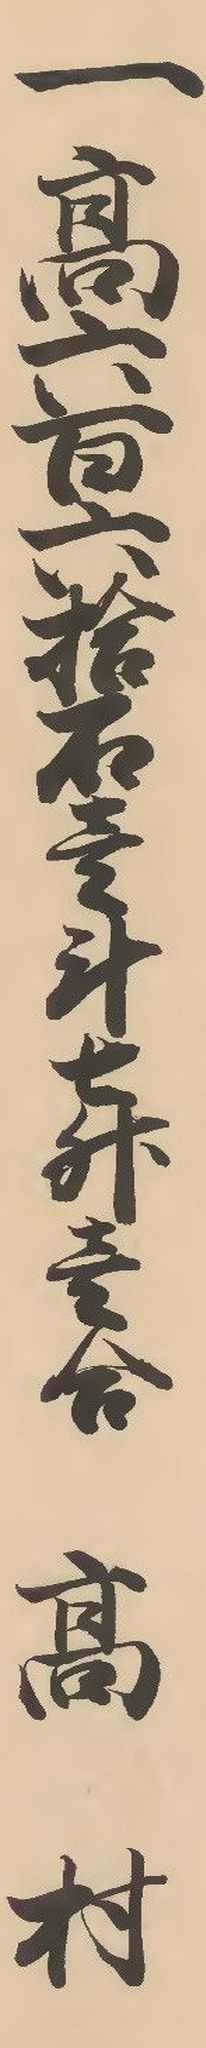一髙六百六拾石壱斗七升壱合髙村
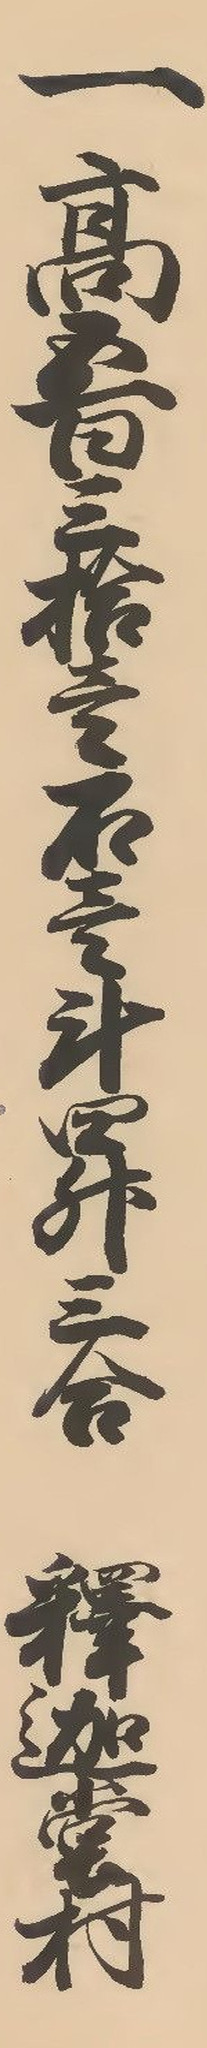一髙五百三拾壱石壱斗四升三合釈迦堂村
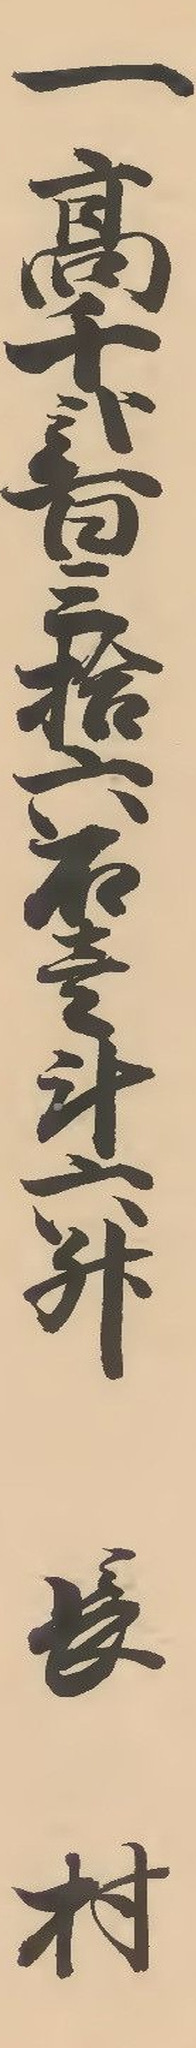一髙千弐百三拾六石壱斗六升長村

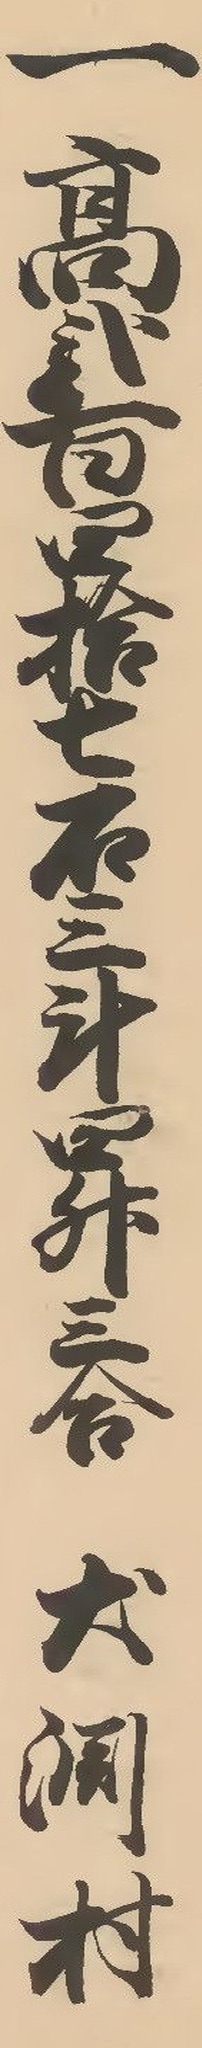一髙弐百四拾七石三斗四升三合犬淵村
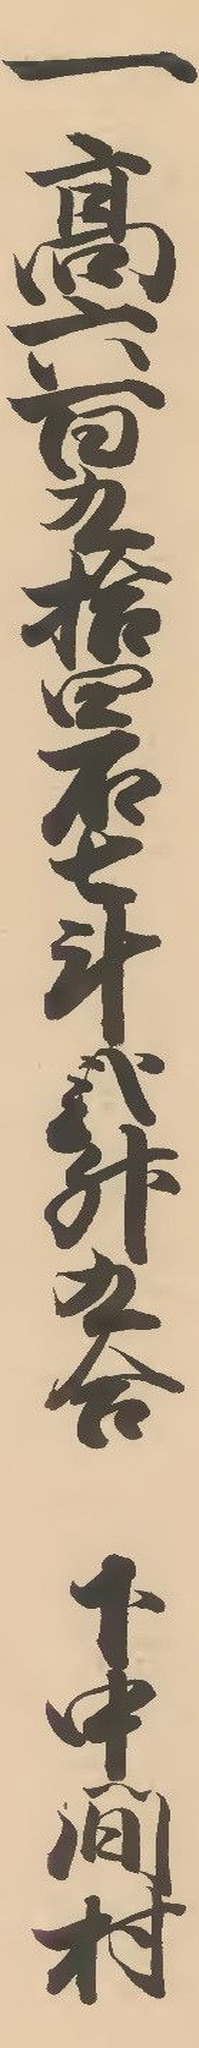一髙六百九拾四石七斗弐升九合下中間村
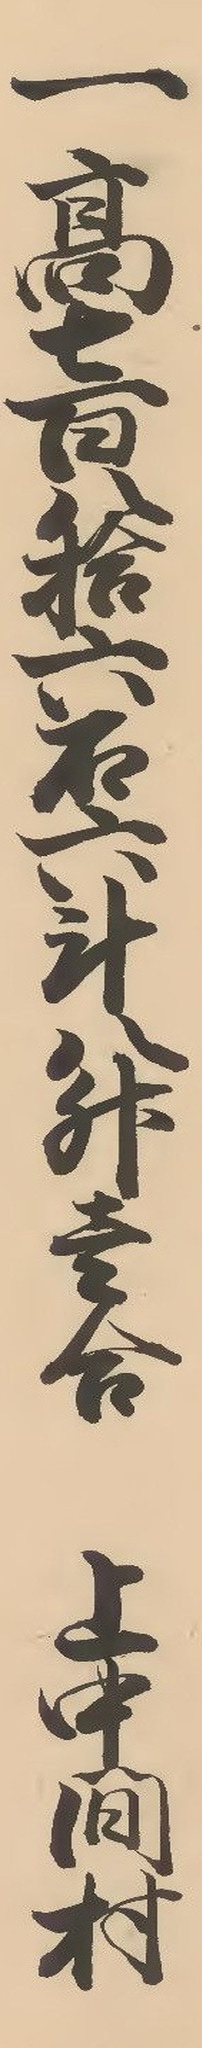一髙七百八拾六石六斗八升壱合上中間村
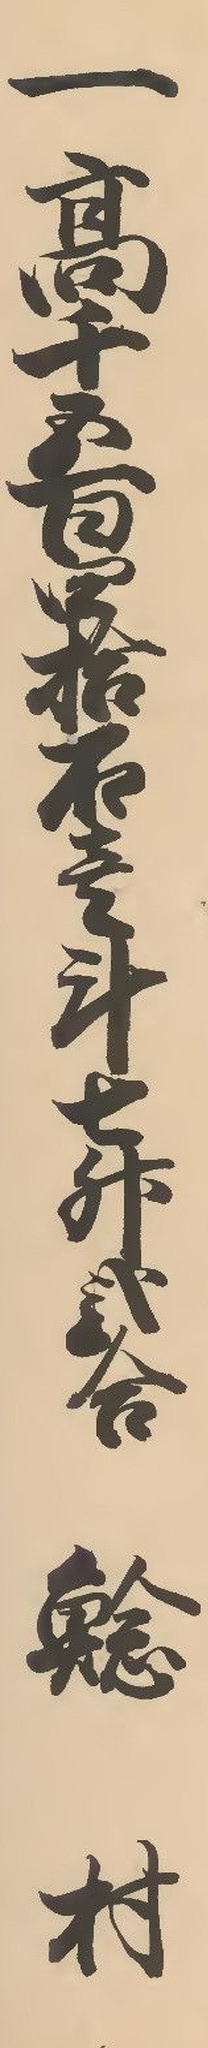一髙千五百四拾石壱斗七升弐合鯰村
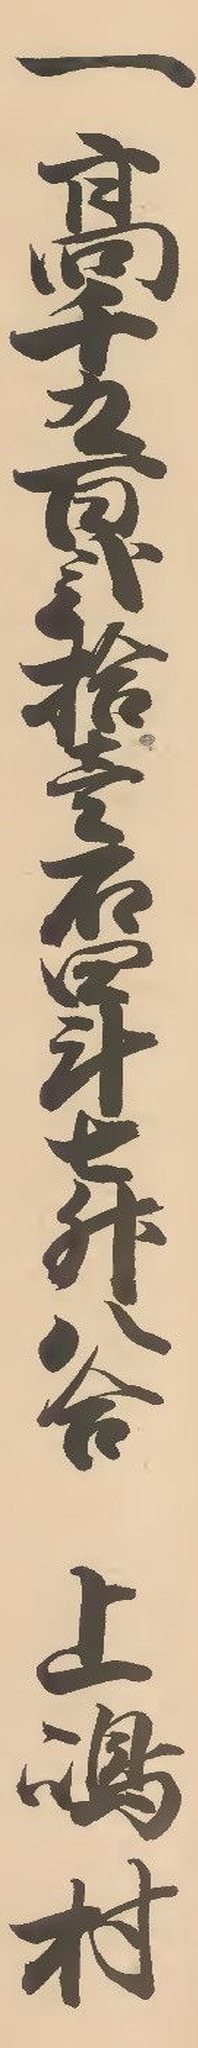一髙千九百弐拾壱石四斗七升八合上嶋村
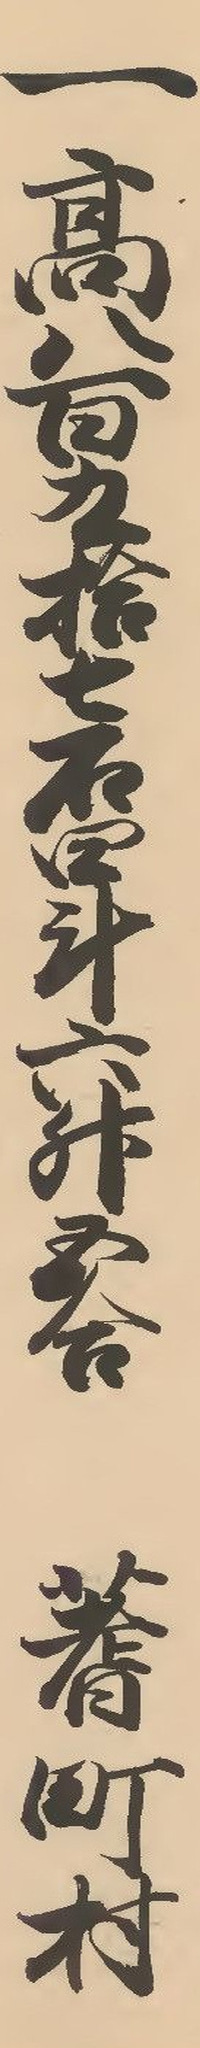一髙八百九拾七石四斗六升五合著町村
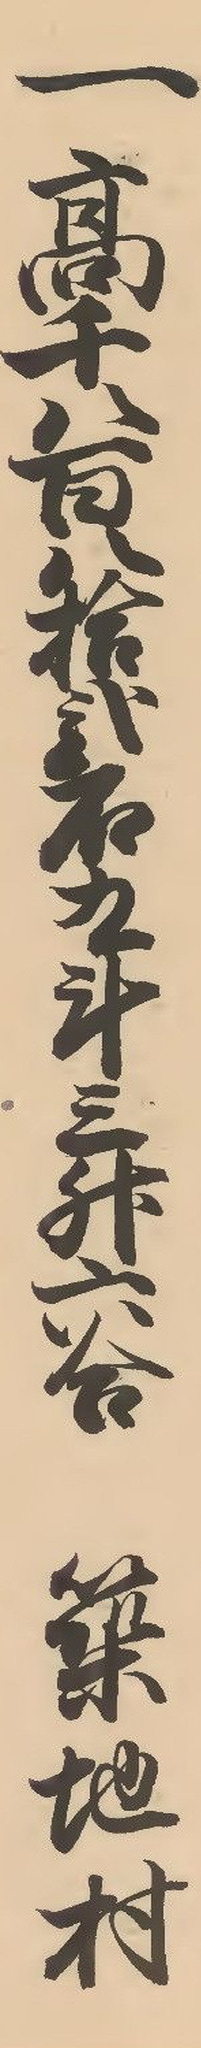一髙千八百八拾弐石九斗三升六合築地村
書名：肥後国郷帳
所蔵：国立公文書館 National Archives of Japan
